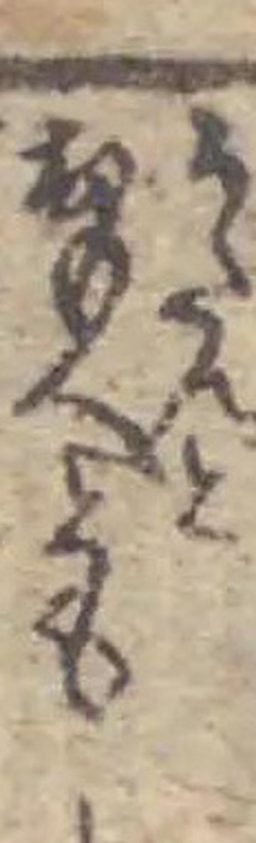おもへとも
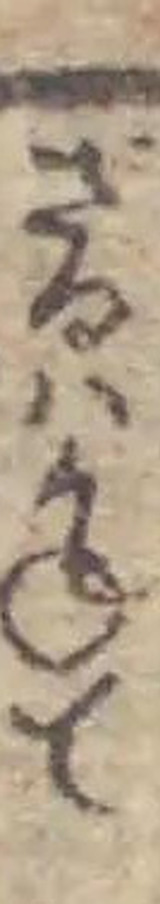さるはかねて
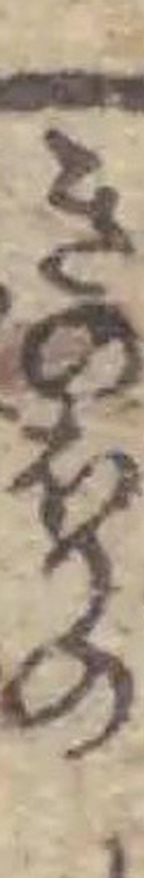きのほりの
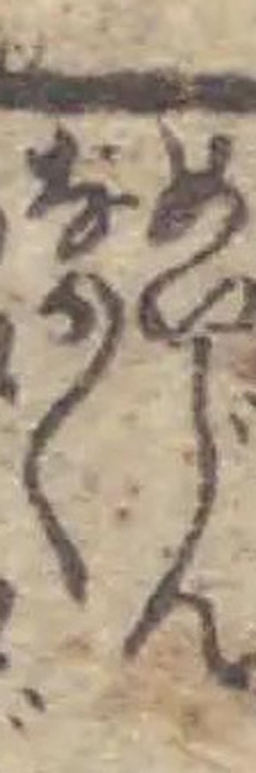なか〳〵
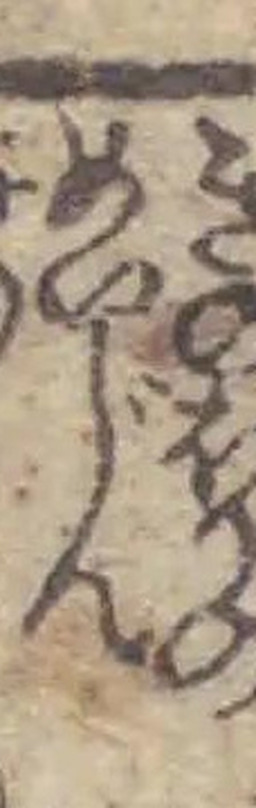めいじん
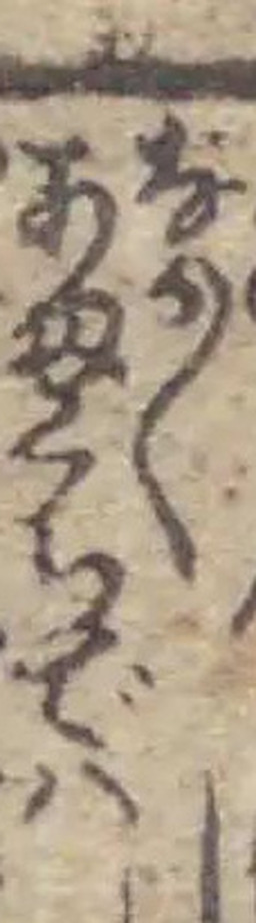あまくちでは
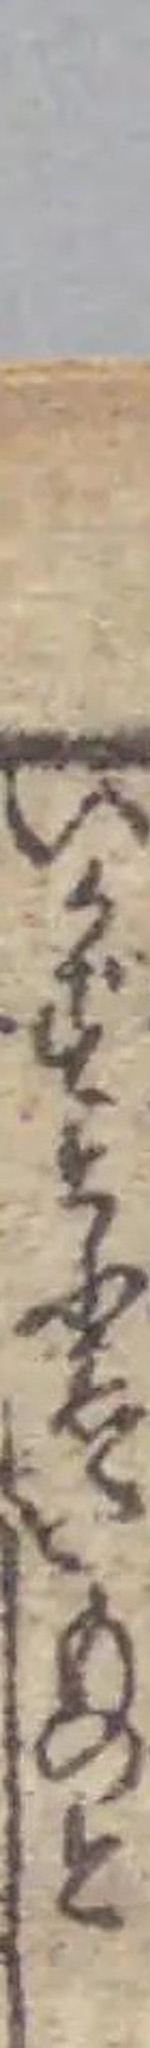いかずとふしたものと
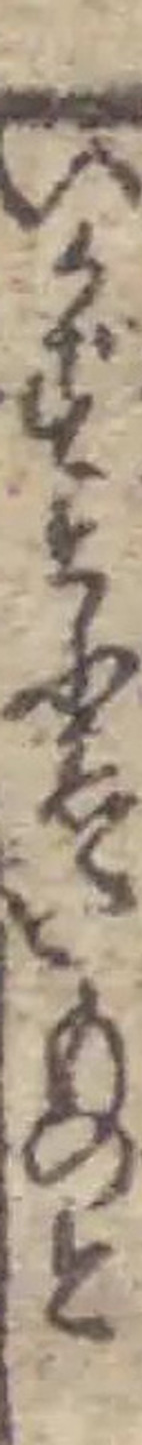いかずとふしたものと
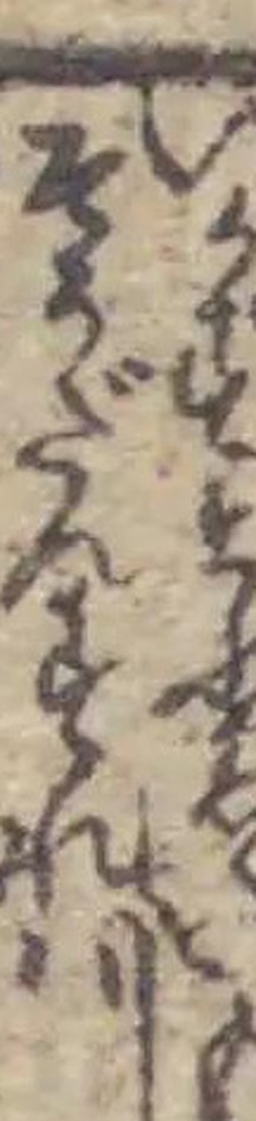そうだんすれば
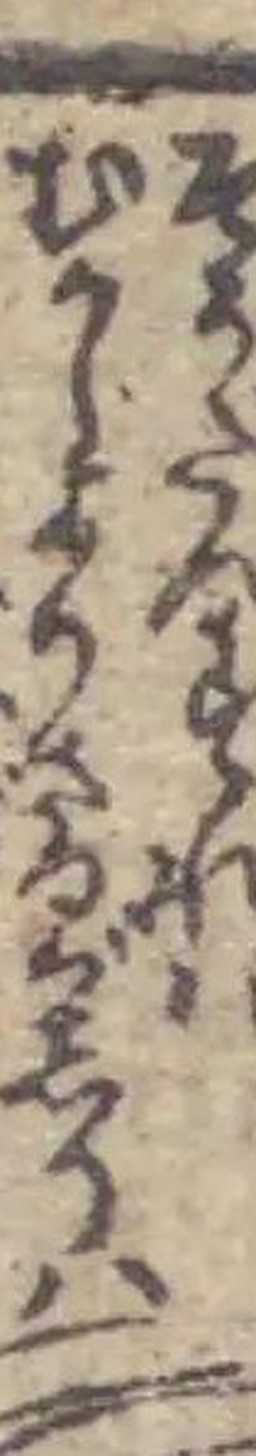むかしよりさるがしりは
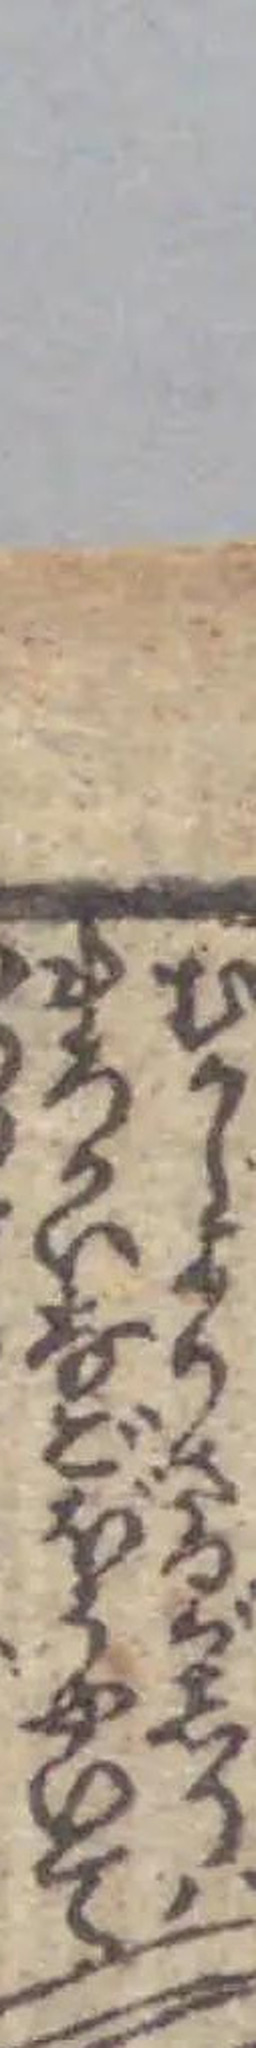まつかいなごぼうやいて
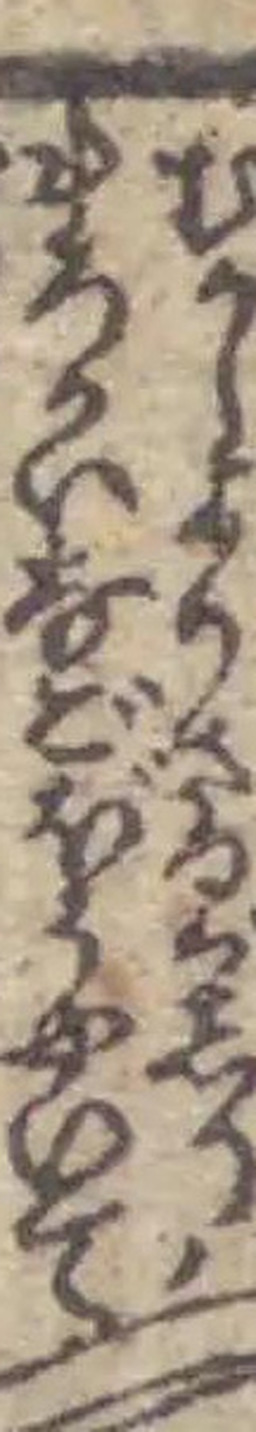まつかいなごぼうやいて
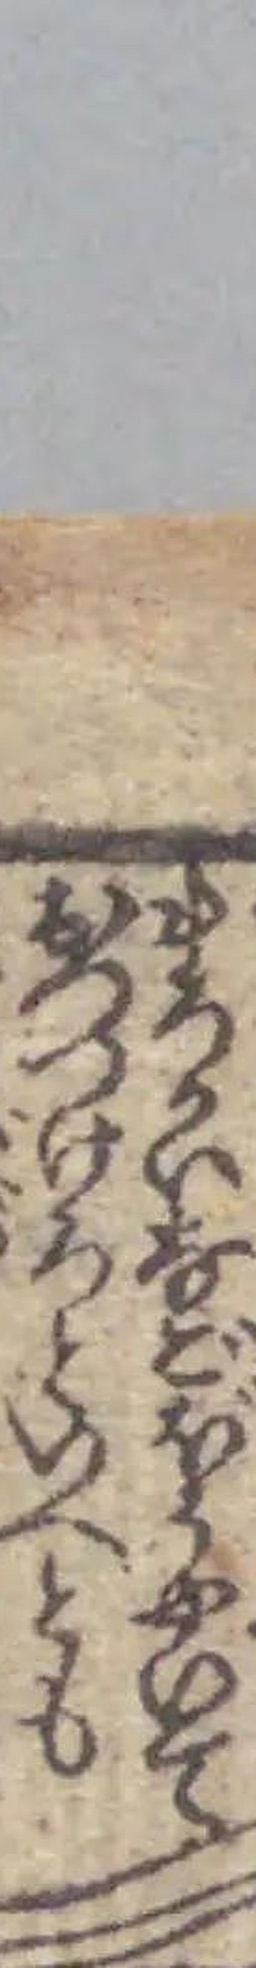おつつけろといへとも
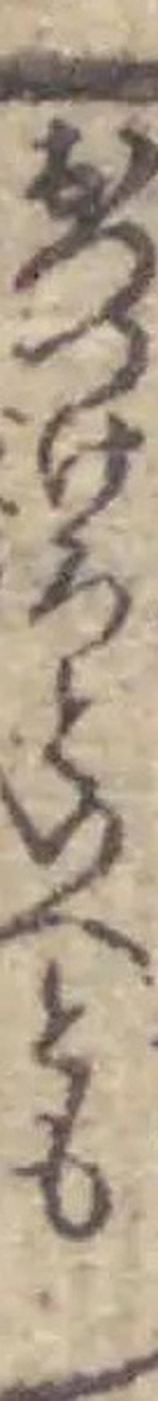おつつけろといへとも
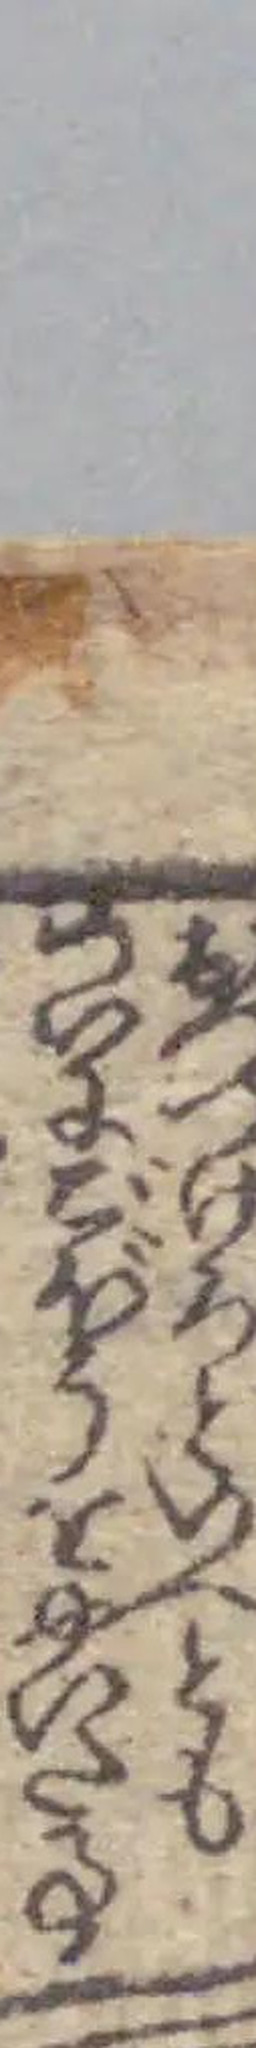ついにごぼうをやいた事
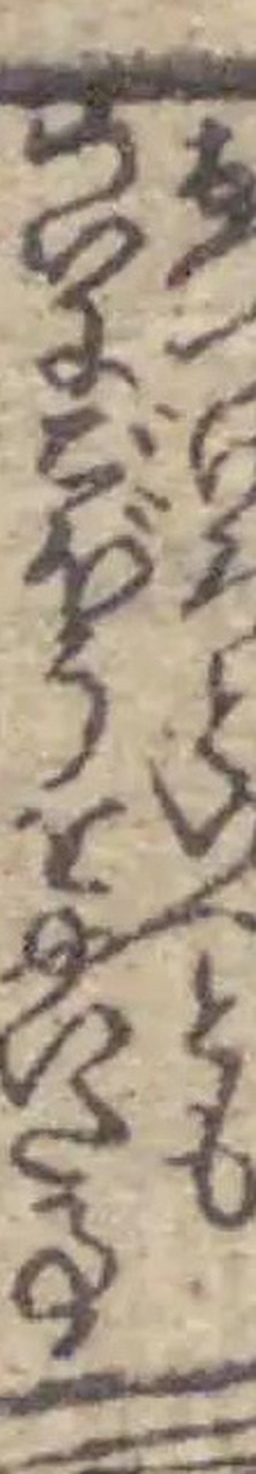ついにごぼうをやいた事
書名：蟹牛房挟多 3巻
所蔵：国立国会図書館 National Diet Library, JAPAN
